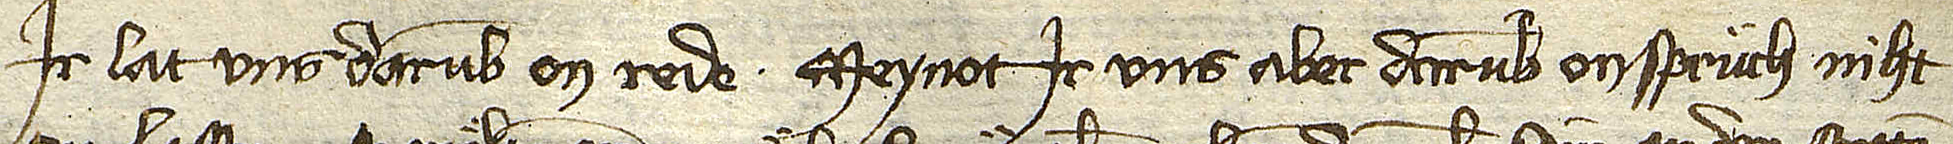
Ir lat vns daru*b on rede . Meynot Ir vns aber daru*b on ſprüch niht
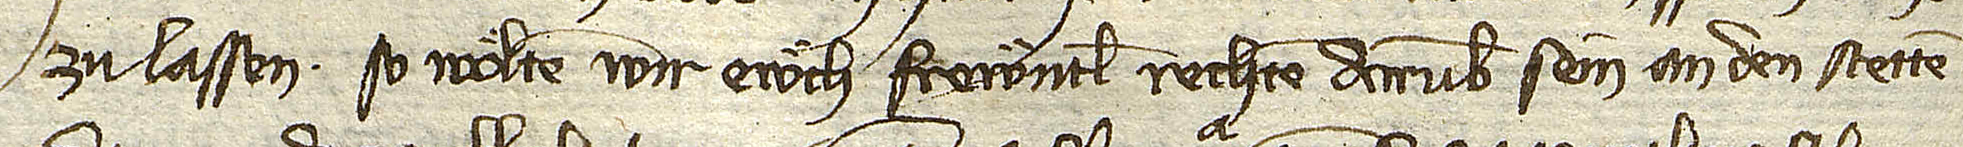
ʒu laſſen . ſo wölte wir ewch frewntl* rechte* daru*b ſein an den ſtette*
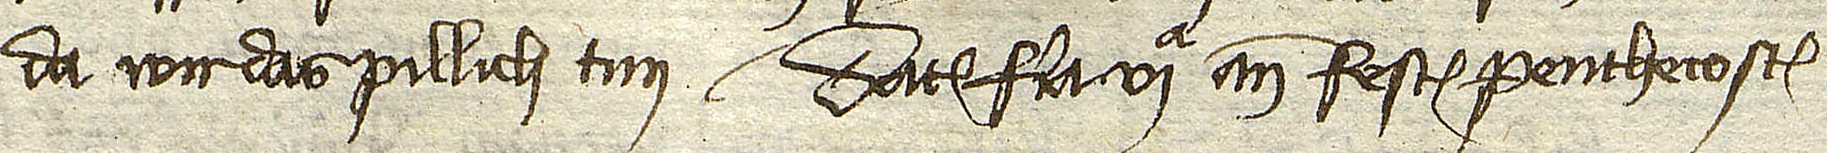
da wir das pillich tun / Dat* fia* vi* an* feſt* Penthecoſt*
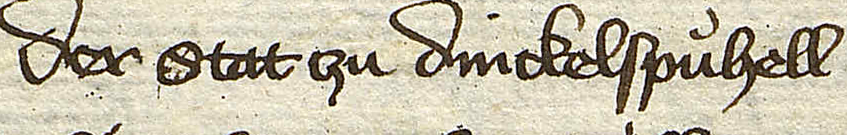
Der Stat cʒu Dinckelſpühell
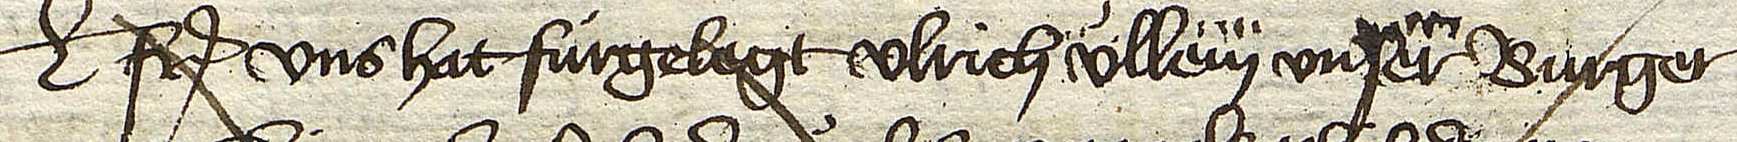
L* fr* vns hat fürgelegt vlrich v̈llein vnſer Burger
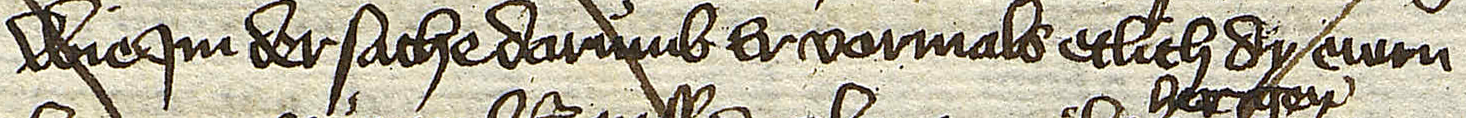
wie Im der ſache darümb Er vormals etlich dy ewrn
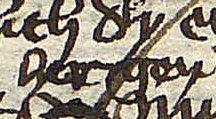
her gen
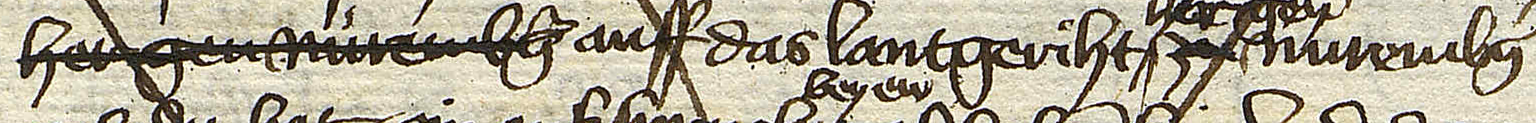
her gen Nüremb*g auff das lantgeriht cʒu Nuremb*g
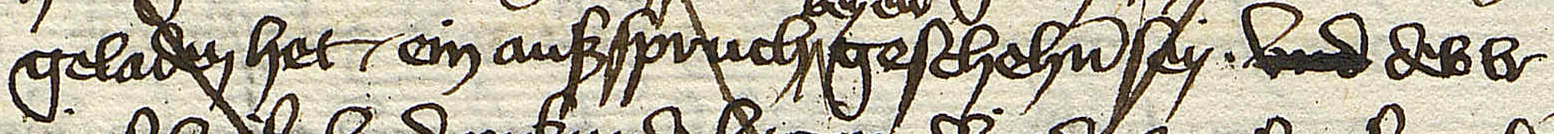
geladen het / ein auſʒſpruch geſcheh*n ſey . Vnd des Er
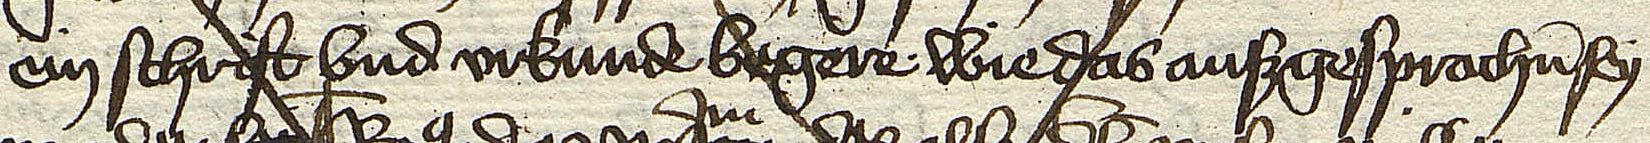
ein ſchrift vnd vrkunde begere . Wie das auſʒgeſproch*n ſey
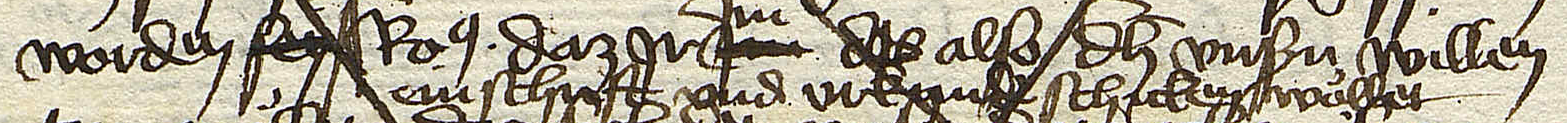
worden ſey Ro* . daʒ Ir Im des alſo d*h* vnſ*n willen
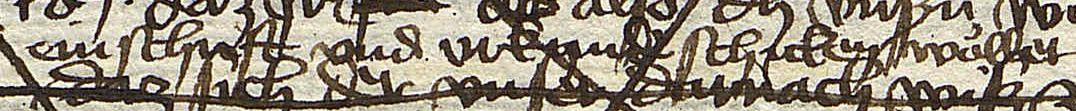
ein ſchrift vnd vrkunde ſchiken wöllet
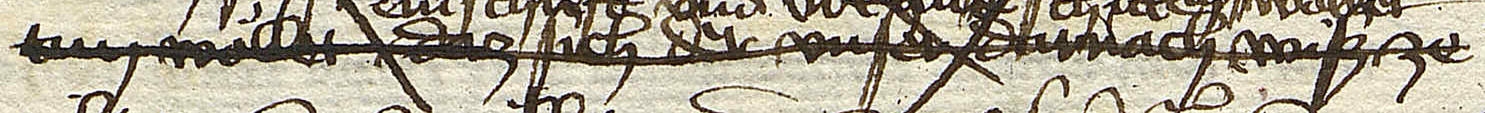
tun wöllet / daʒ ſich der vnſer darnach wiſʒ cʒe
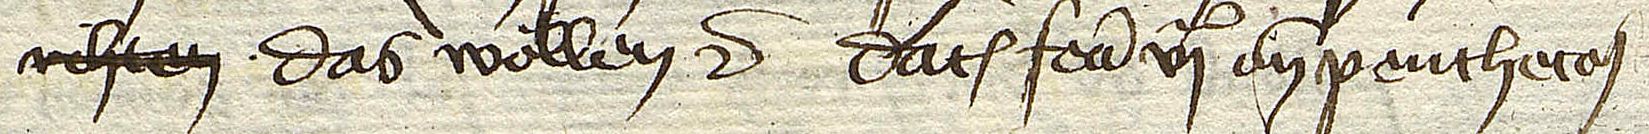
richten . das wöllen ec* dat fea* vi* an* penthecoſ*
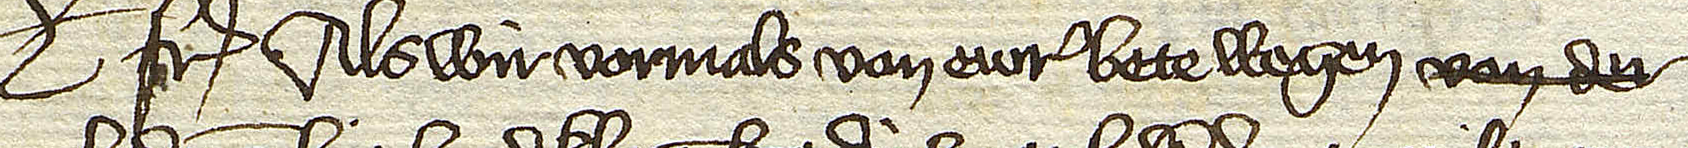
L* fr* . Als wir vormals von ew*r bete wegen von der
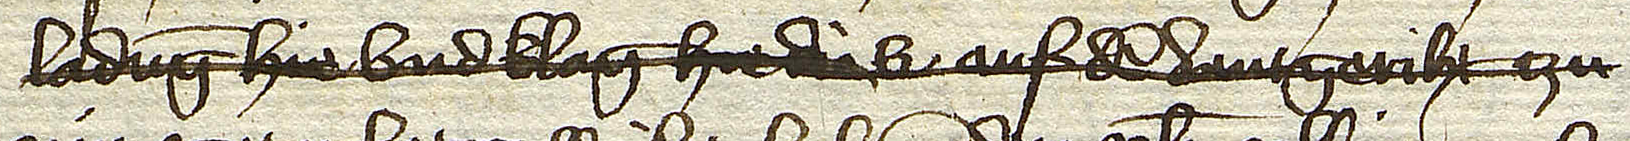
ladu*g hie vnd klag hie die Er auf de* lantgeriht cʒu
